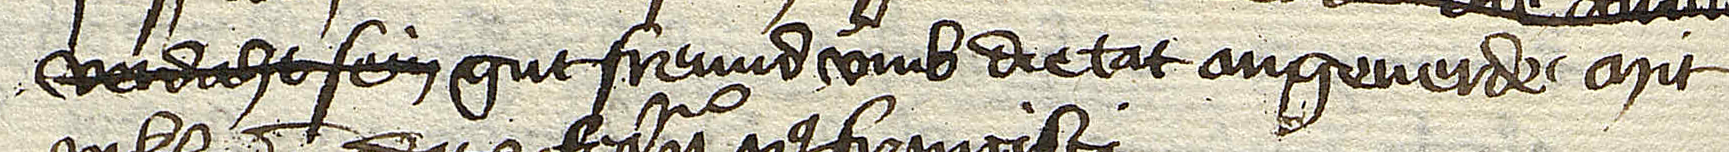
verdacht ſein gut freund v̈mb die tat ongeuerde / Mit
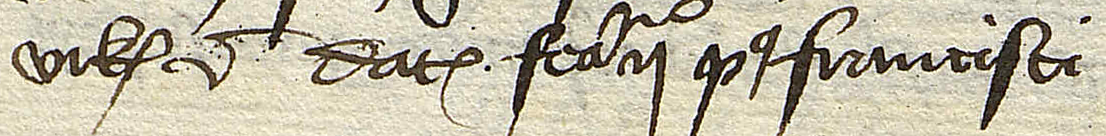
vrk* ec* dat* fea* ii* p* franciſti
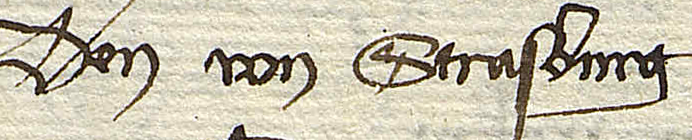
Den von Straſburg
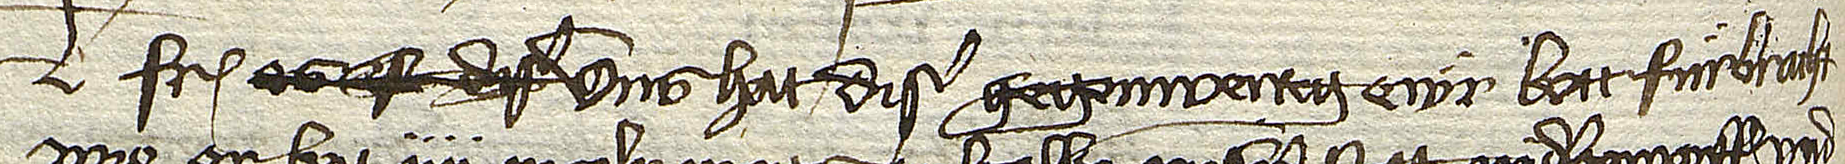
L* fr* es iſt diſ* Vns hat diſ* gegenwertig ewr bott fürbracht
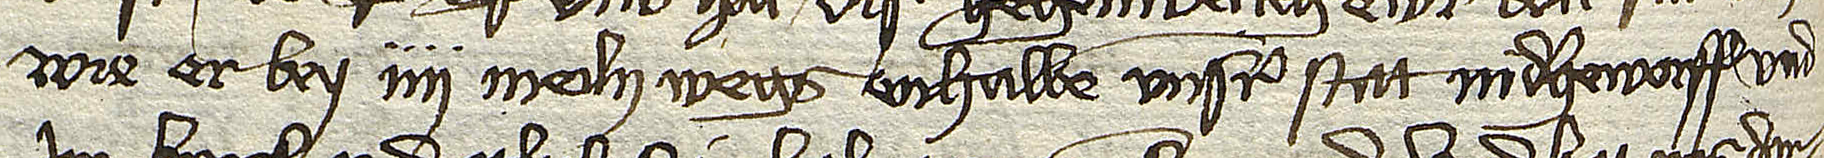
wie er bey iiii meiln wegs onhalbe* vnſ*r ſtat nid*geworff* vnd
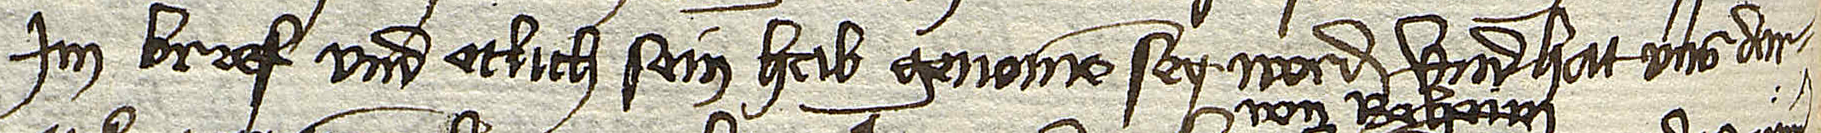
Im brief vnd etlich ſein hab genome* ſey word* / Vnd hat vns dar =
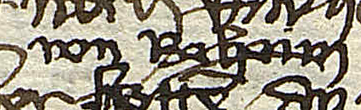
von Beheim
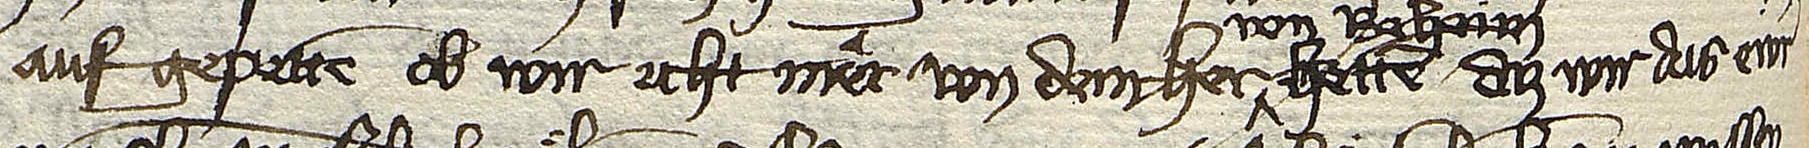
auf gepette* ob wir icht mër von dem her hette* / daʒ wir das ew*r
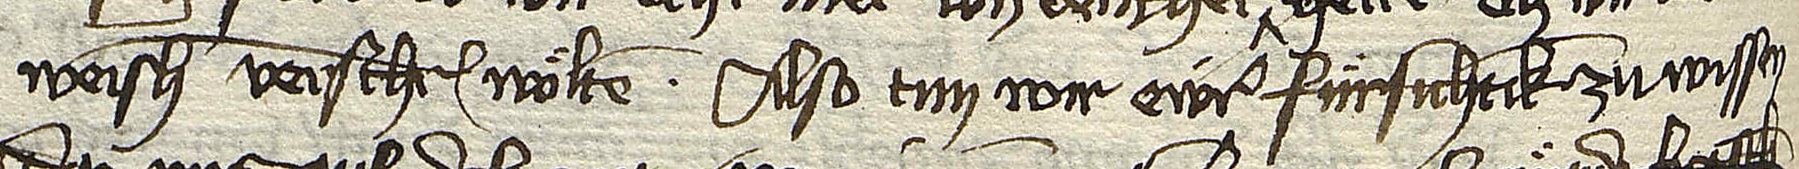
weiſh* verſchr* wölte* . Alſo tun wir ew*r fürſichtik* ʒu wiſſen
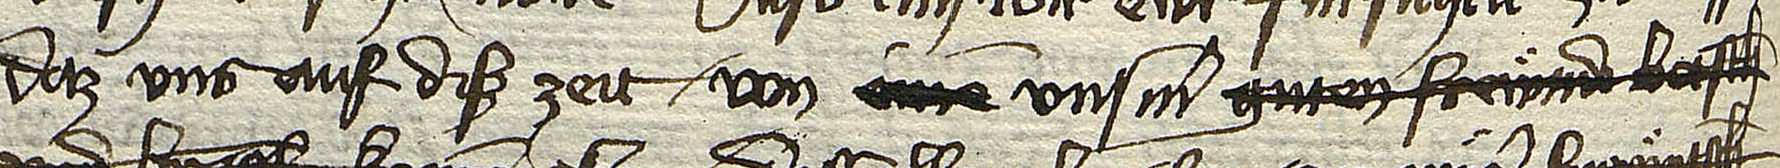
daʒ vns auf diſʒ ʒeit / von eine* vnſ*m guten frewnde botſch*
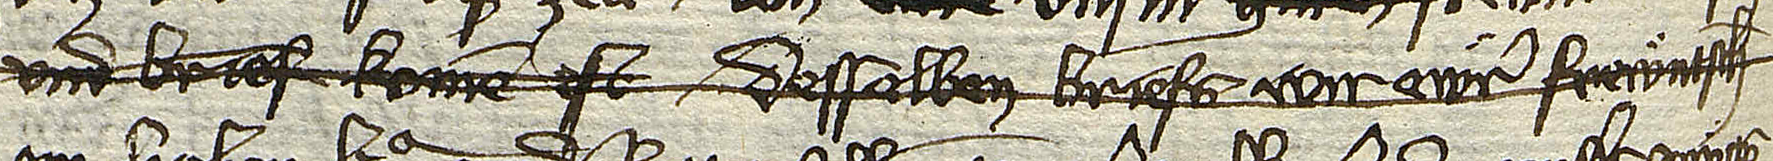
vnd brief kome* iſt / Deſſelben briefs wir ew*r frewntſch*
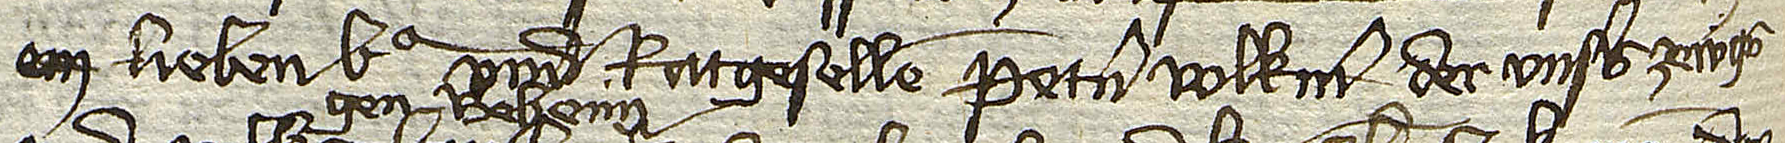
ein lieben b* vnd Ratgeſelle* Pet*n volkm* der vnſ*s ʒewgs
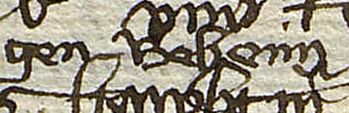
gen Beheim
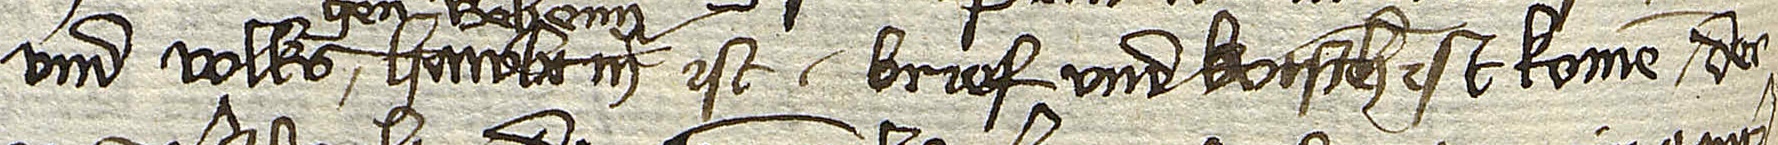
vnd volks hawbtm* iſt / brief vnd botſch* iſt kome* / der
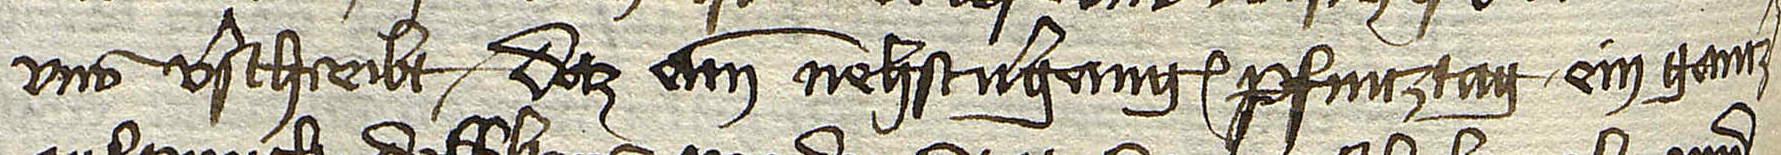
vns v*ſchreibt / daʒ am* nehſt u*gang* Pfincʒtag / ein gancʒ*
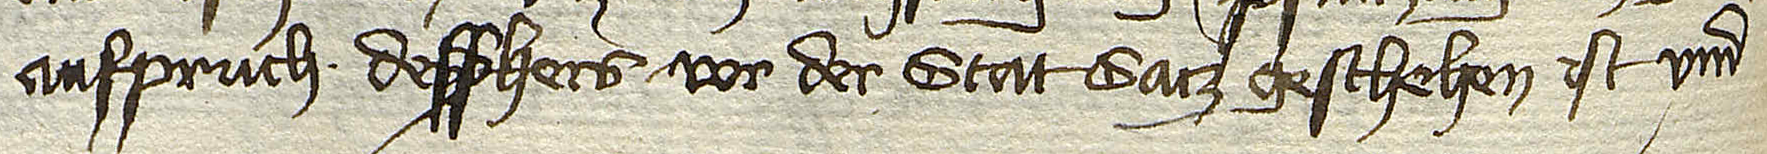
aufpruch . deſſ* hers / vor der Stat Sacʒ geſchehen iſt vnd
